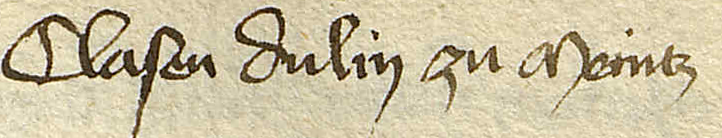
Claſen Dulin cʒu Meincʒ
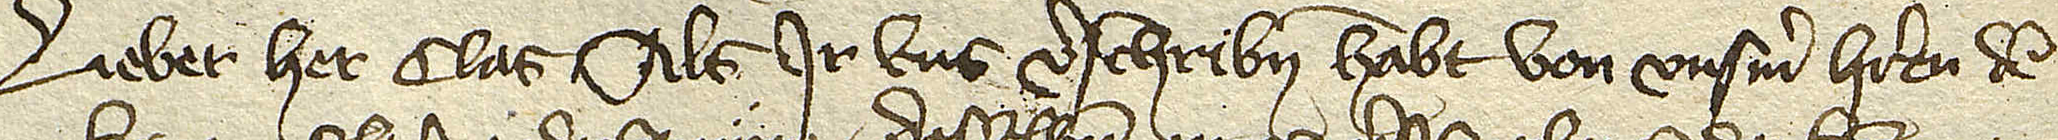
Lieber her Clas / Als Ir vns v* ſchribn* habt von vnſm* hr*en d*
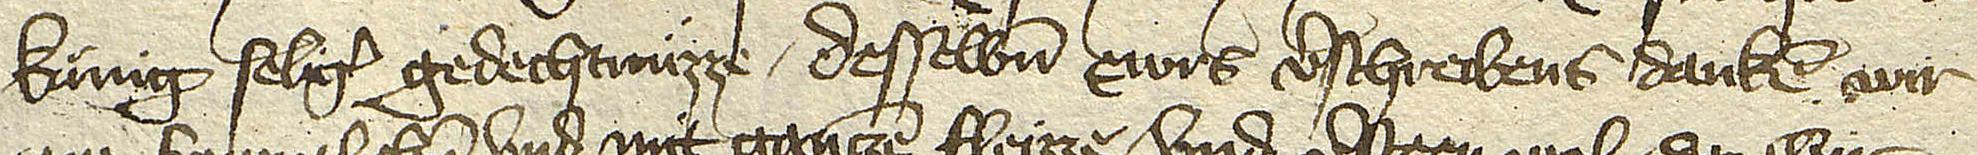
künig* ſelig* gedechtnüʒʒe / deſſelbn* ewrs v*ſchreibens / danke* wir
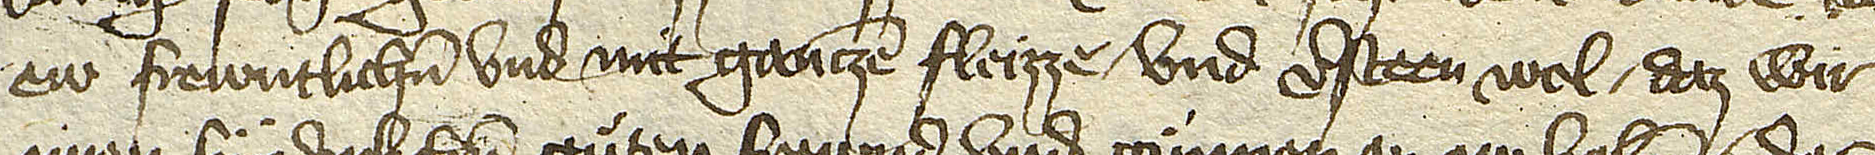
ew frewntlichn* vnd mit gancʒe* fleiʒʒe / vnd v*ſteen wol / daʒ wir
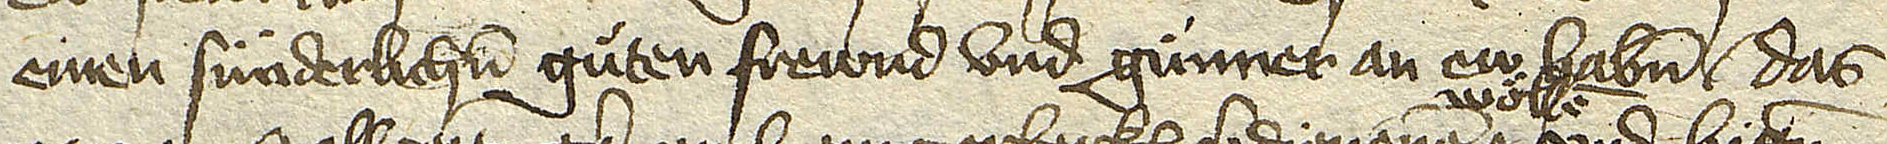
einen ſünderlichn* guten frewnd vnd günner an ew habn* / das
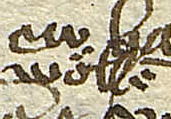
wölle*
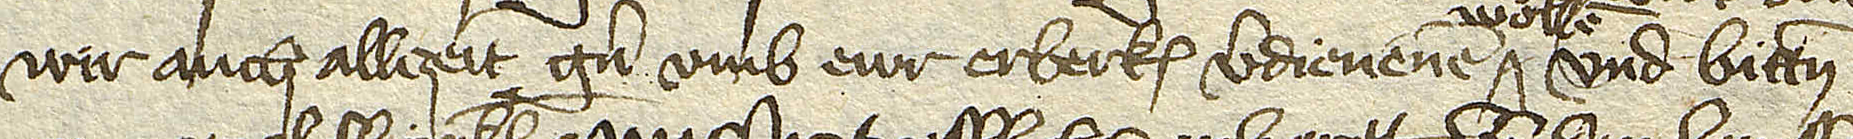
wir auch allcʒeit gn* vmb ewr erberk* v*diene* vnd bittn*
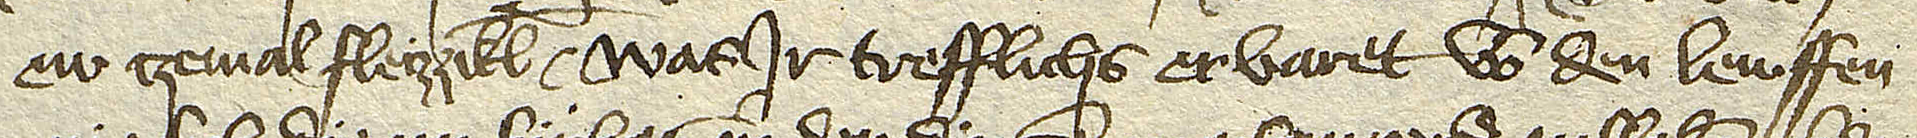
ew cʒemal fleiʒʒikl* / was Ir trefflichs* ervaret vo* den lewffen
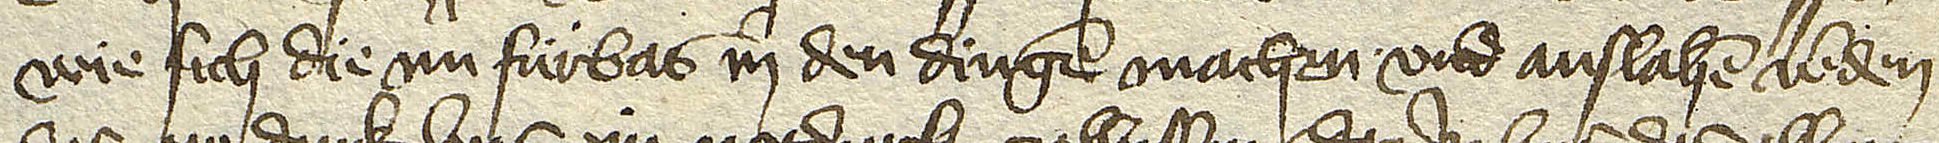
wie ſich die nu fürbas in den dinge* machen vnd anſlahe* w*den
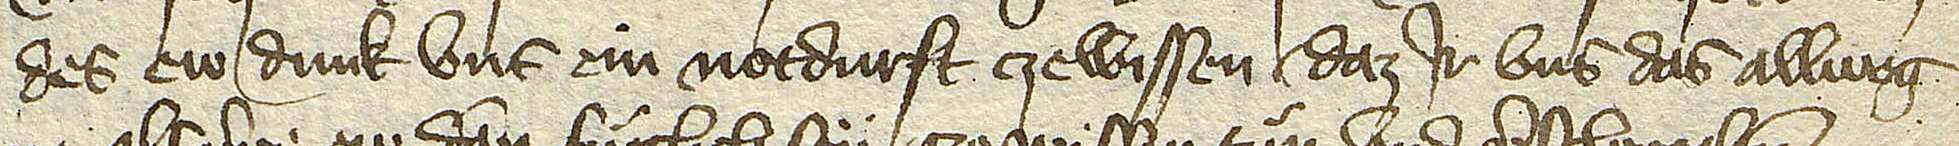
des ew dunk vns ein notdurft cʒewiſſen / daʒ Ir vns das allweg
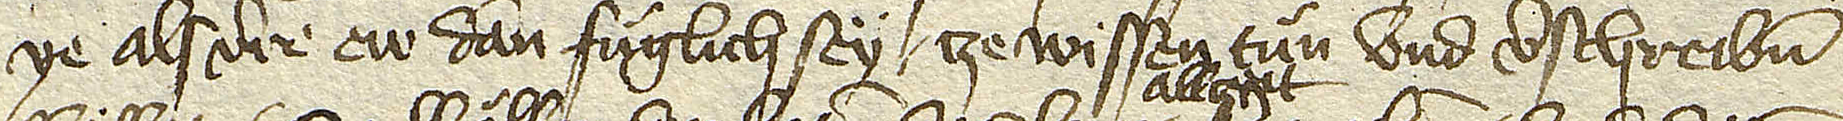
ye alſ v*re ew dan* füglich ſey / cʒe wiſſen tun vnd v*ſchreibn*
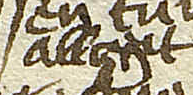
allcʒeit
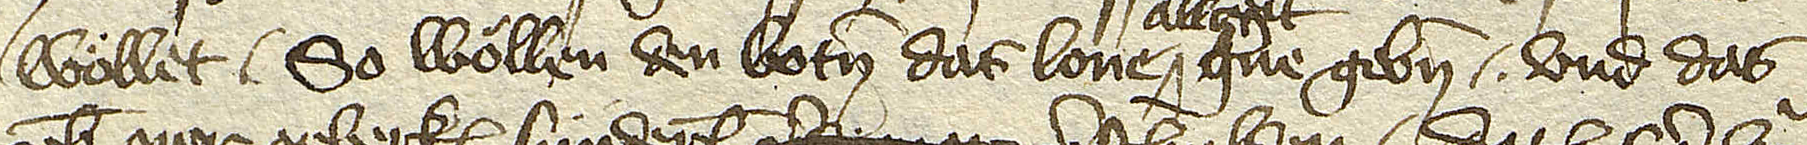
wöllet / So wöllen den botn* das lone / g*ne gebn* / . vnd das
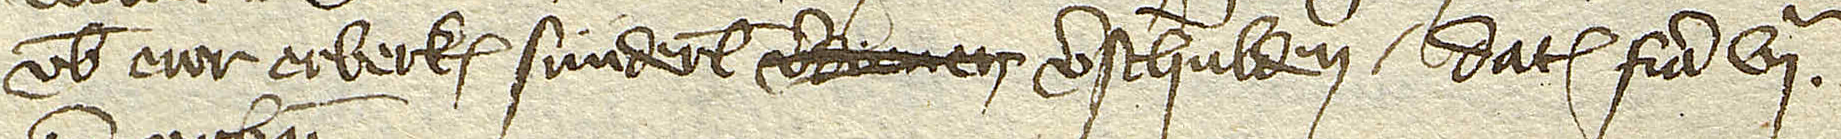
vb* ewr erberk* ſünderl* v*dienen v*ſchulden / dat* fia* vi* .
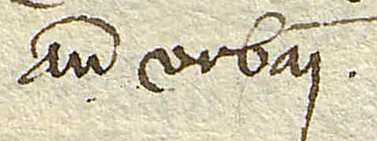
an* vrbai* .
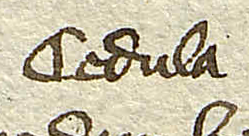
Cedula
